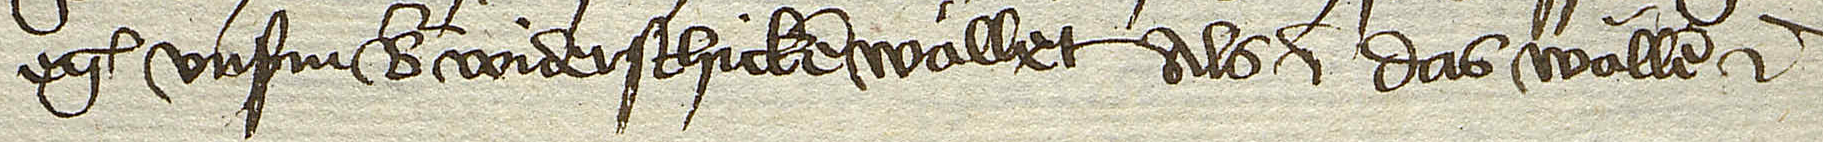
eg* vnſ*m B* widerſchicke* wöllet Als ec* das wölle* ec*
